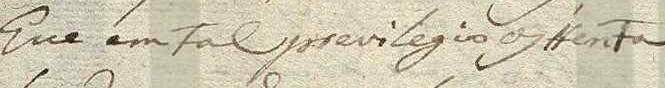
Que em tal previlegio osttenta
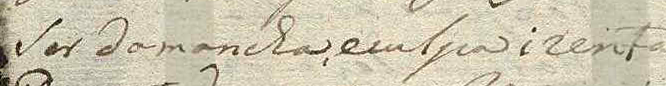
Ser da mancha, e culpa izenta
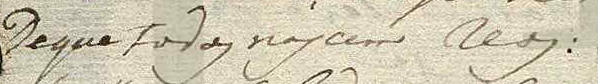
De que todos nascem Reos:
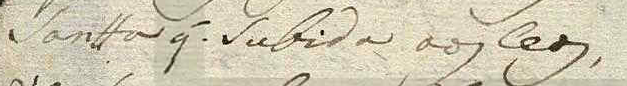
Santta q̄ subida aos Ceos
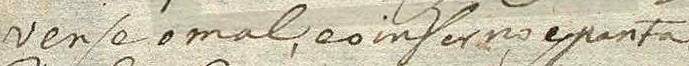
Vense o mal, e o inferno espanta
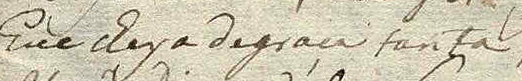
Que cheya de graça tanta,
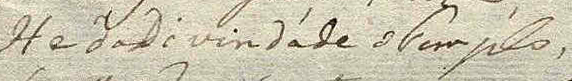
He da Divindade o Templo,
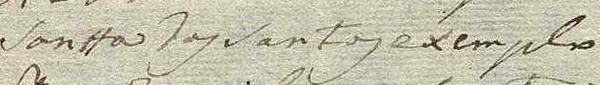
Santta dos Santos exemplo
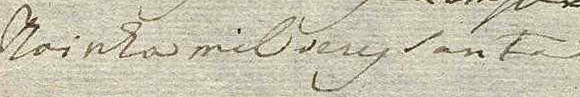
Rainha mil vezes Santa
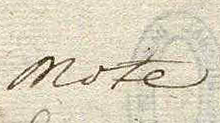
Mote
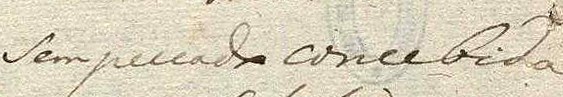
Sem peccado concebida
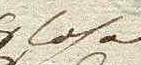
glosa
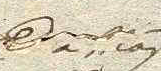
E a mãy
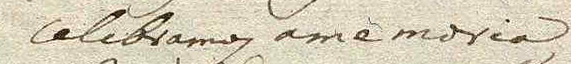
Celebramos a memoria
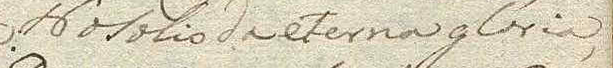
No Solio da eterna gloria,
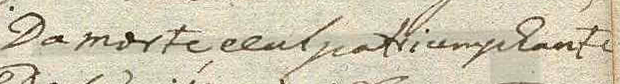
Da morte, e culpa triumphante
